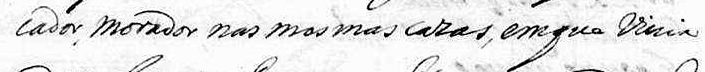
cador morador nas mesmas cazas, em que viuia
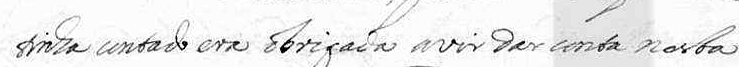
tinha contado era obrigada a vir dar conta nesta
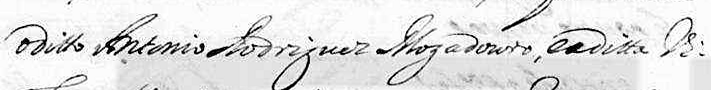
o ditto Antonio Rodriguez Mogadouro, e a ditta Vi
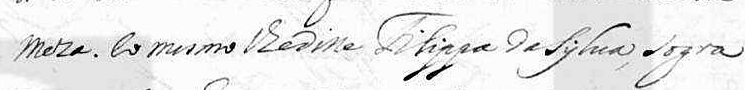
meza. e o mesmo lhe disse Filippa da Sylua, sogra
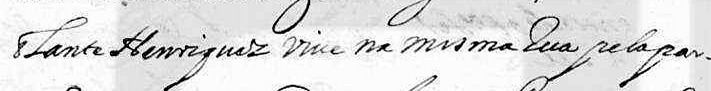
olante Henriquez viue na mesma Rua pela par
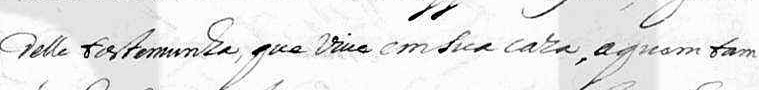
delle testemunha, que viue em sua caza, a quem tam
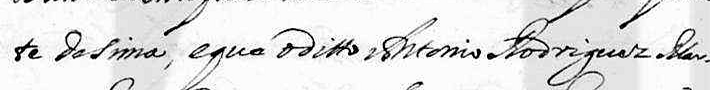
te de sima, e que o ditto Antonio Rodriguez Mar
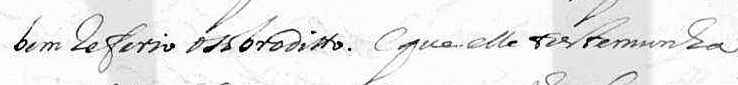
bem Referio o sobreditto. E que elle testemunha
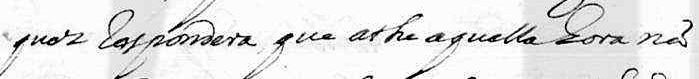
quez Respondera que athe aquella hora naõ
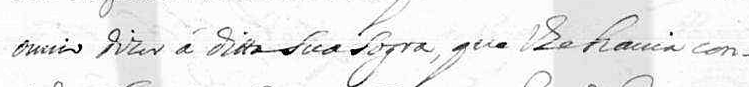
ouuio dizer á ditta sua sogra, que lhe hauia con
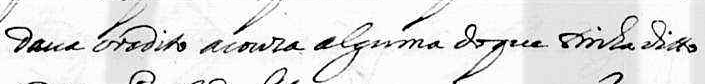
daua credito a couza alguma do que tinha ditto
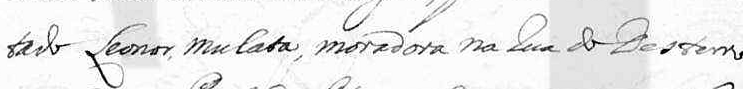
tado Leonor, mulata, moradora na Rua do Desterro
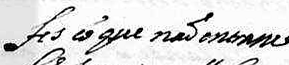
fes cō que naõ entrasse
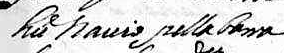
hū nauio pella barra
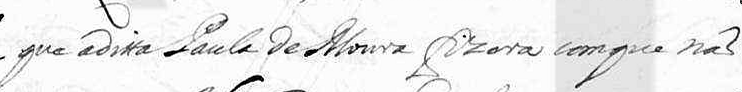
que a ditta Paula de Moura fizera com que naõ
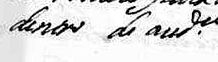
dentro de aud.u
